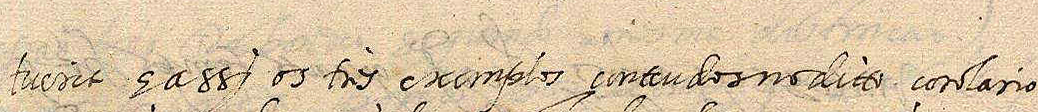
tuerit E assj os tres exemplos conteudos no ditto corolario
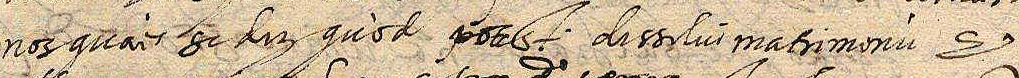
nos quais se diz quod potest. dissolui matrimonū E
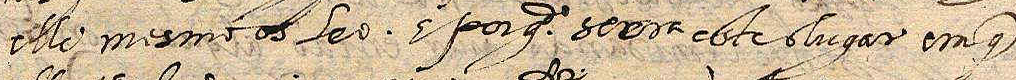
elle mesmo os Leo. E perg.do se era este o lugar em q̄
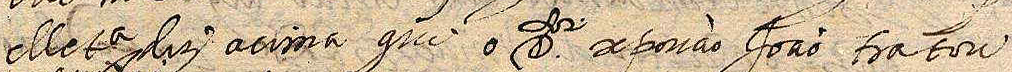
elle ta diz acima que o D.tor xpouão Joaõ tratou
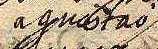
a questaõ
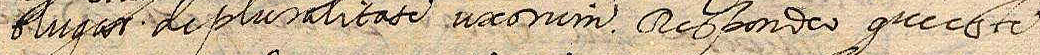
o lugar de pluralitate uxorum. Respondeo que este
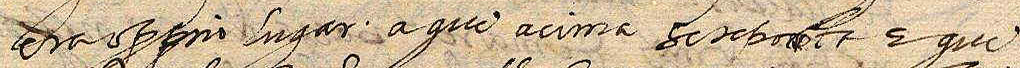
era o ꝓprio lugar. a que acima se reporta E que
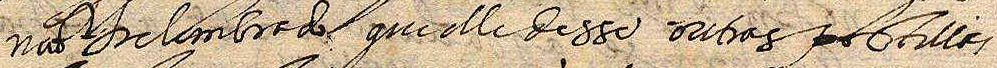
não he lembrado que elle desse outras postillas
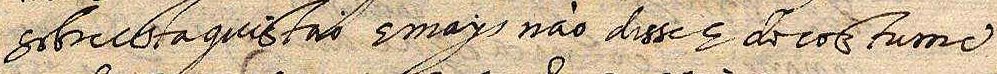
sobre esta questaõ E mays não disse E do costume
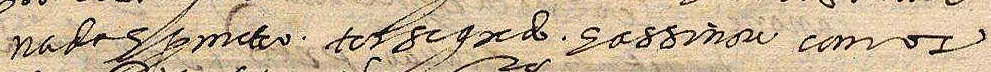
nado E ꝓmeteo. ter segredo. E assinou com os
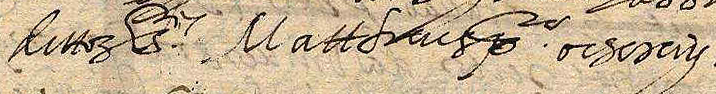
ditos S.res Mattheus pra. o escrevy
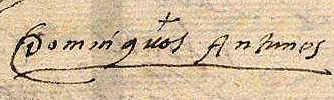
Dominguos Antunes
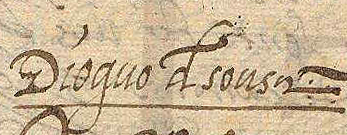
Dioguo d̄ sousa
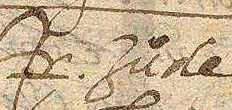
fr. Jūde
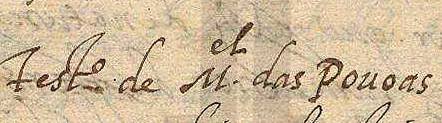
testo. de M.el das Pouoas
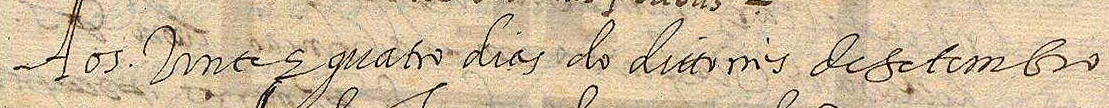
Aos Vinte E quatro dias do ditto mes de Setembro
